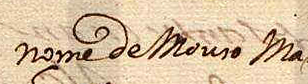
nome de Mouro Ma
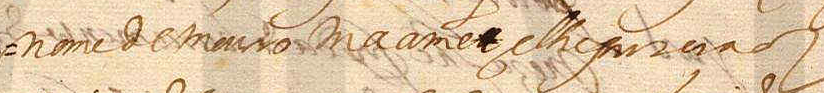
nome de mouro maamet e lhe puzeraõ
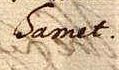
hamet.
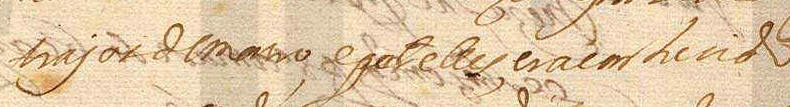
trajos de mouro, e por elles, era conhecido
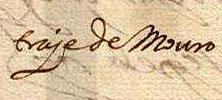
traje de Mouro
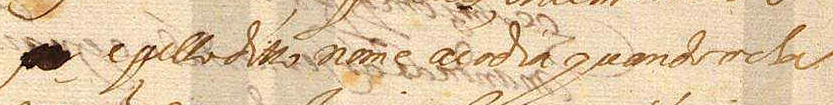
por e pello ditto nome acodia quando o cha
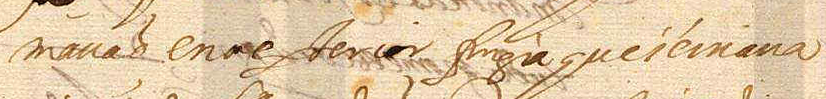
mauaõ e no exterior fingia que ieiuaua
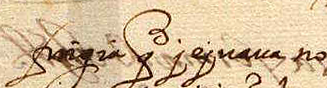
fingia q̄ jejuaua no
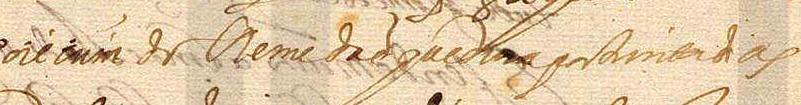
o ieium do Remedaõ que dura por trinta dias
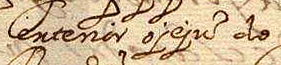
exterior o jejū do
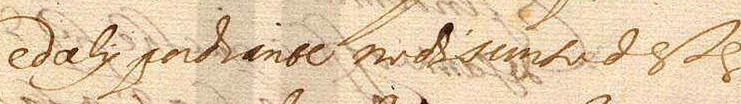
e daly por diante no discurso destes
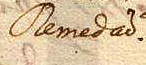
Remedaõ.
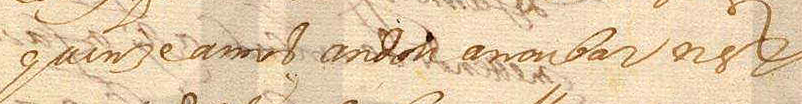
quinze annos andou a rroubar nos
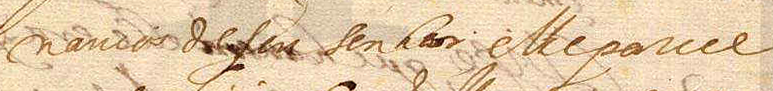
nauios de seu senhor e lhe parece
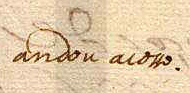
andou a cosso.
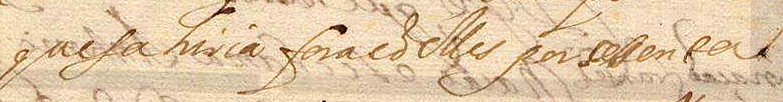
que sahiria fora cō elles por sessenta
